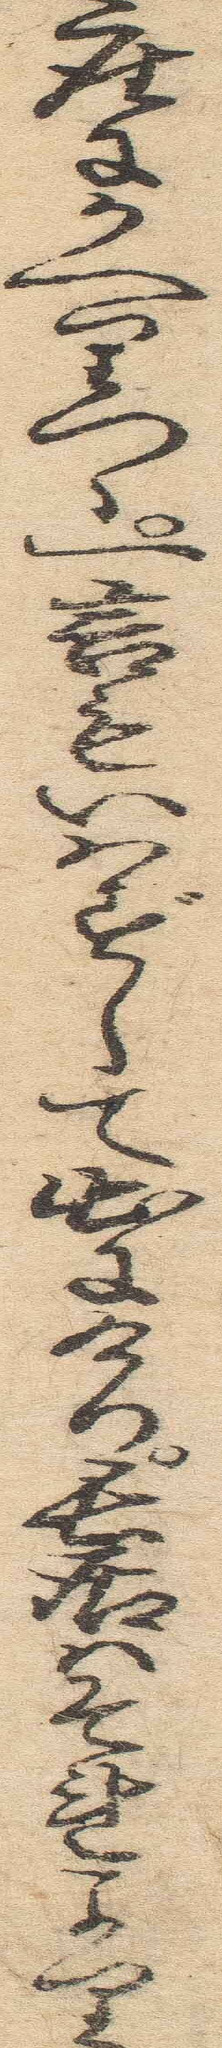座にかへりつゝ。一言もいはずして出にけり。長居はそれより
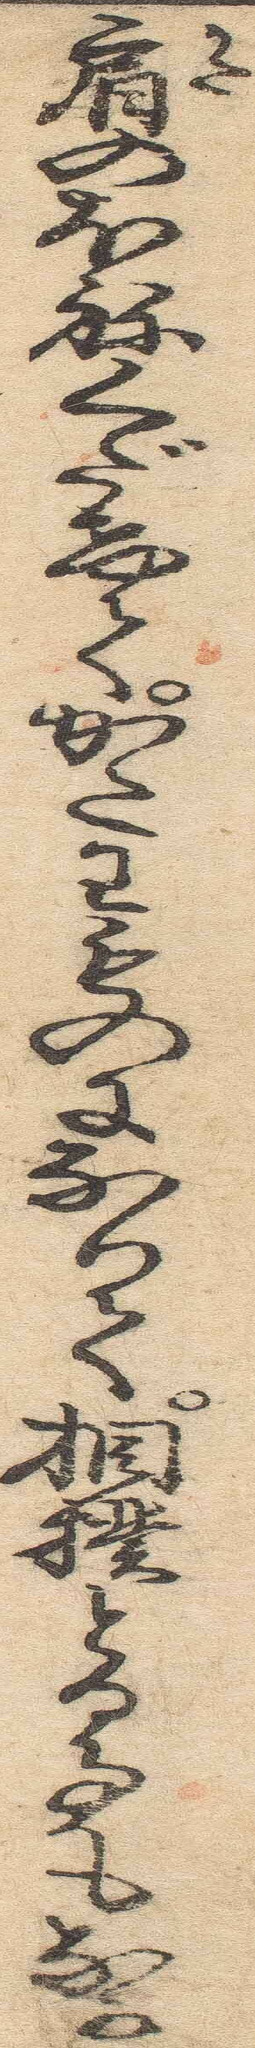肩のほねくだけて。かたわものになりて。相撲とる事もなか
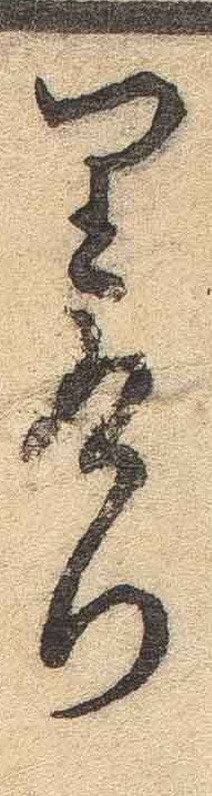りけり
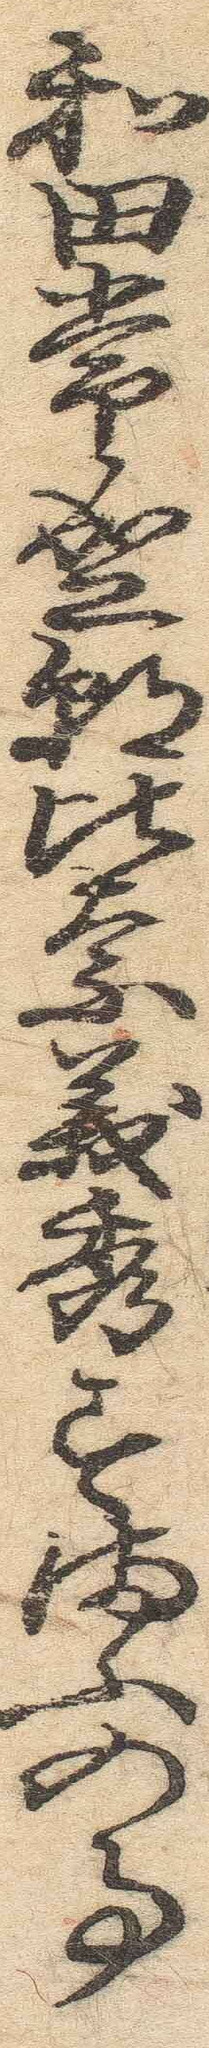和田常盛朝比奈義秀相撲の事
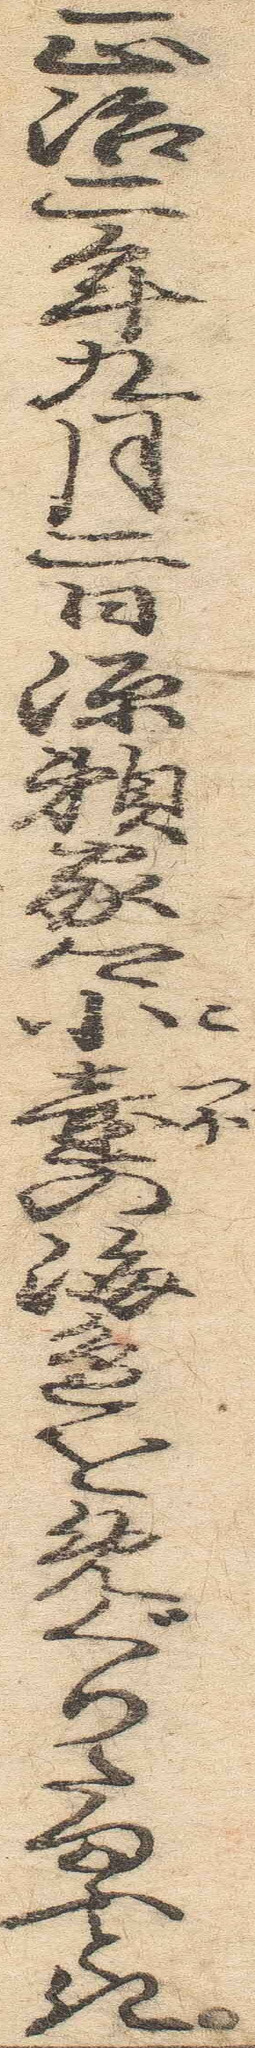正治二年九月二日源頼家卿小壺の海辺をめぐりたまふとき
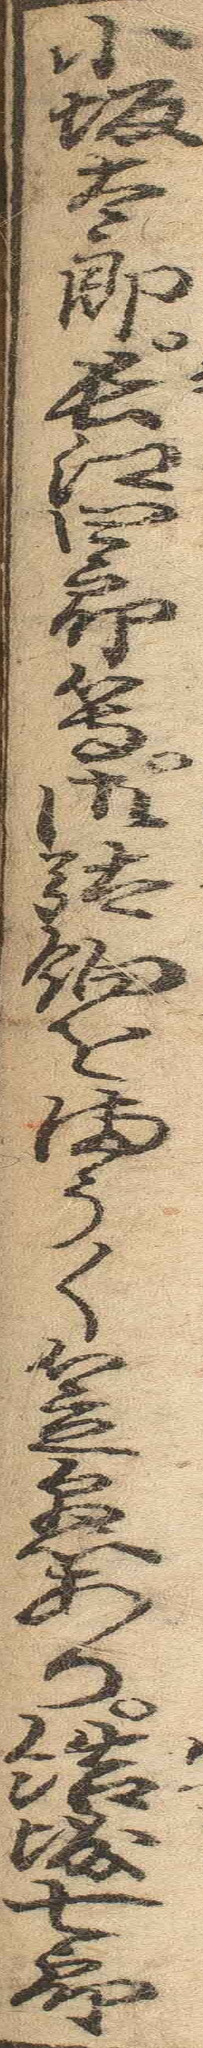小坂太郎。長江四郎等。御駄餉をます〳〵笠懸あり。結城七郎
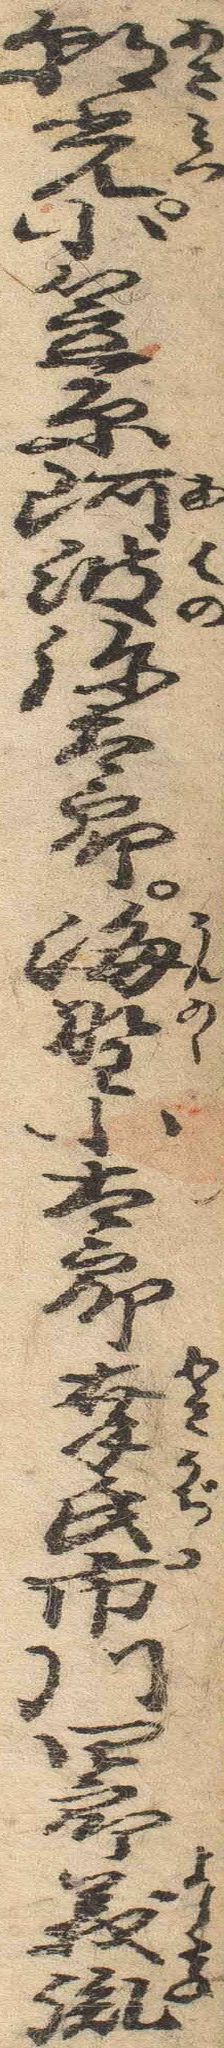朝光。小笠原阿波弥太郎。海野小太郎幸氏市川四郎義胤
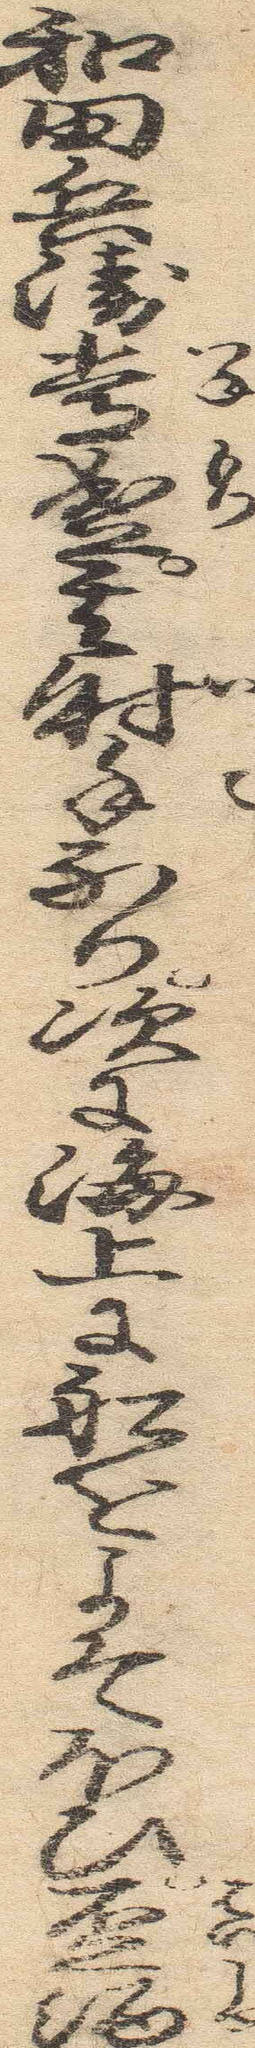和田兵衛常盛。其射手なり。次に海上に船をよそほひ。盃酒
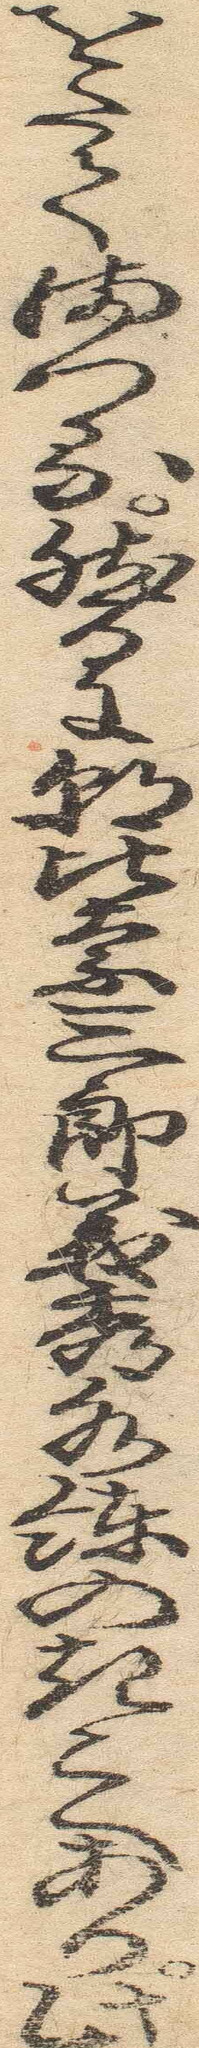をたてまつる。然るに朝比奈三郎義秀水練のきこへあり。此
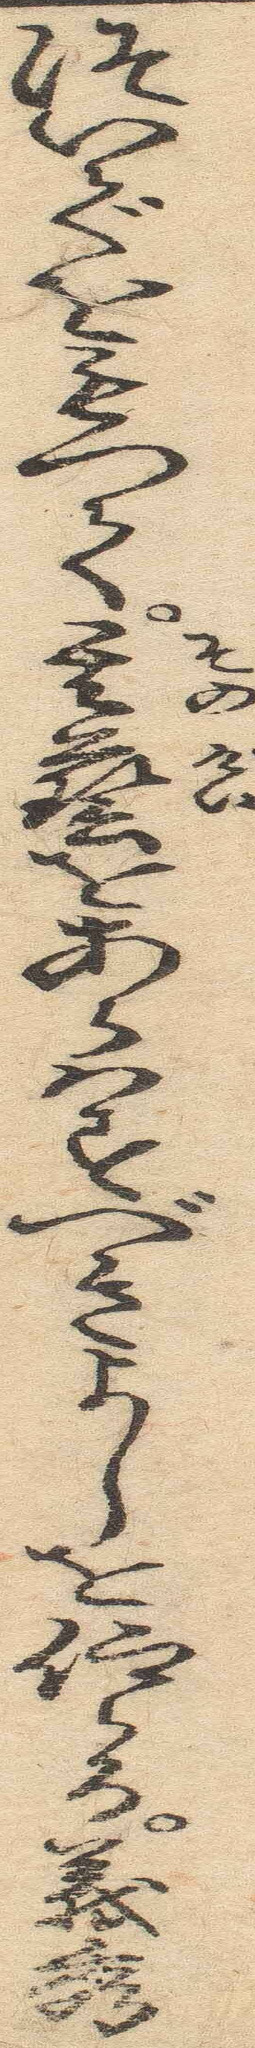ついでをもつて。其芸をあらはすべきよしを仰らる。義秀
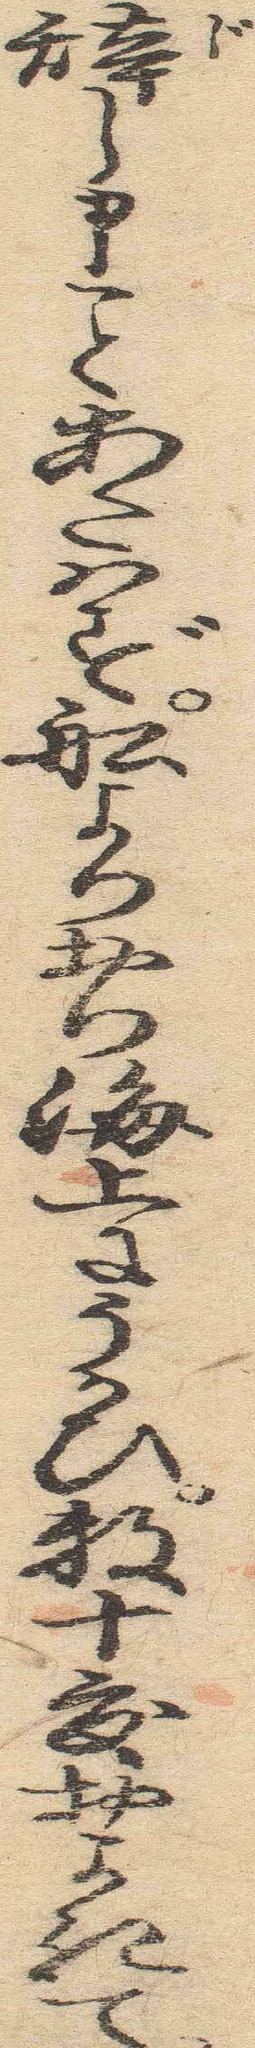辞し申ことあたはず。船よりおり海上にうかひ。数十度およきて。
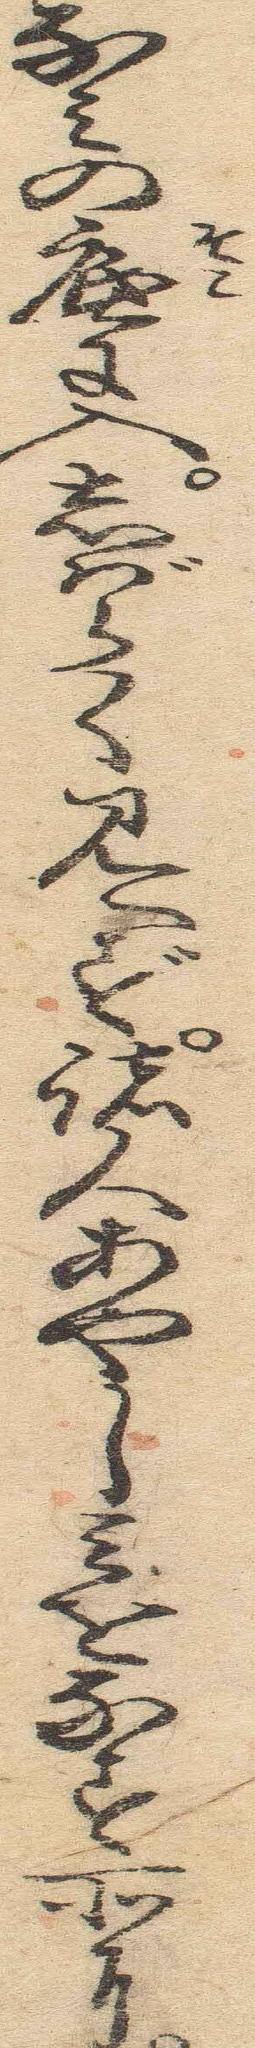なみの底に入。しばらく見へず。諸人あやしみをなす所に。
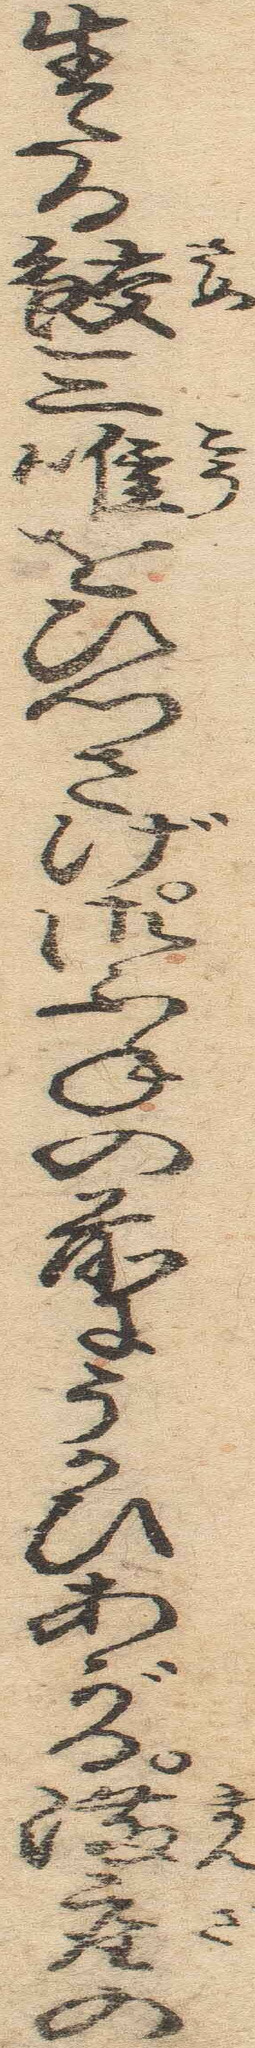生たる鮫三唯をひつさげ。御ふねの前にうかひあがる。満座の
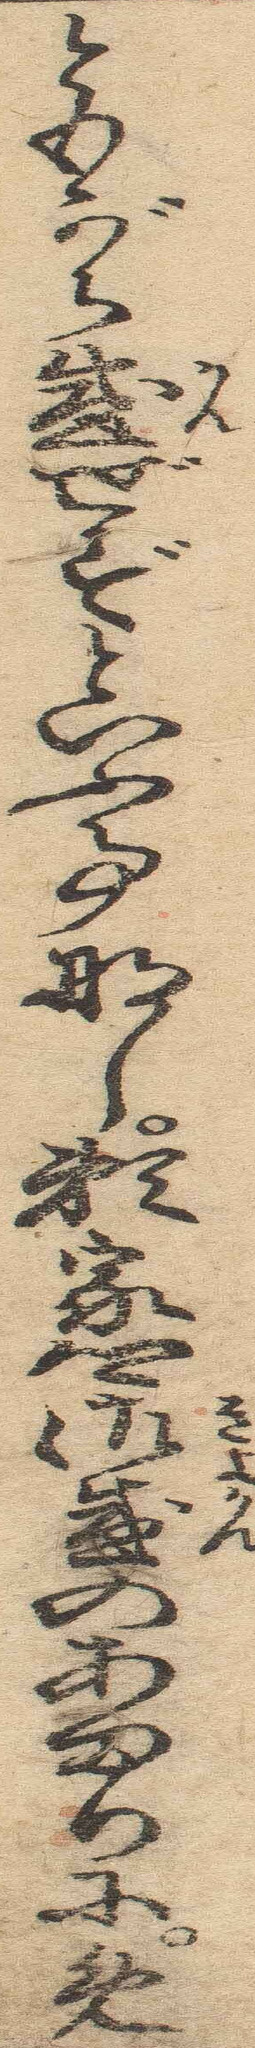ともがら感ぜずといふ事なし。頼家卿御感のあまりに。め
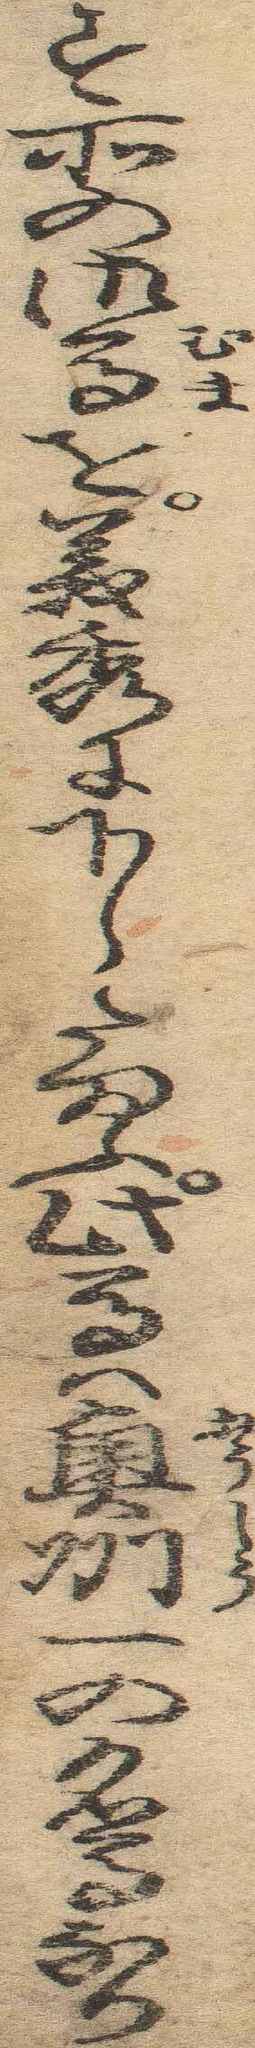す所の御馬を。義秀に下したまふ。此馬は奥州一の名馬なり

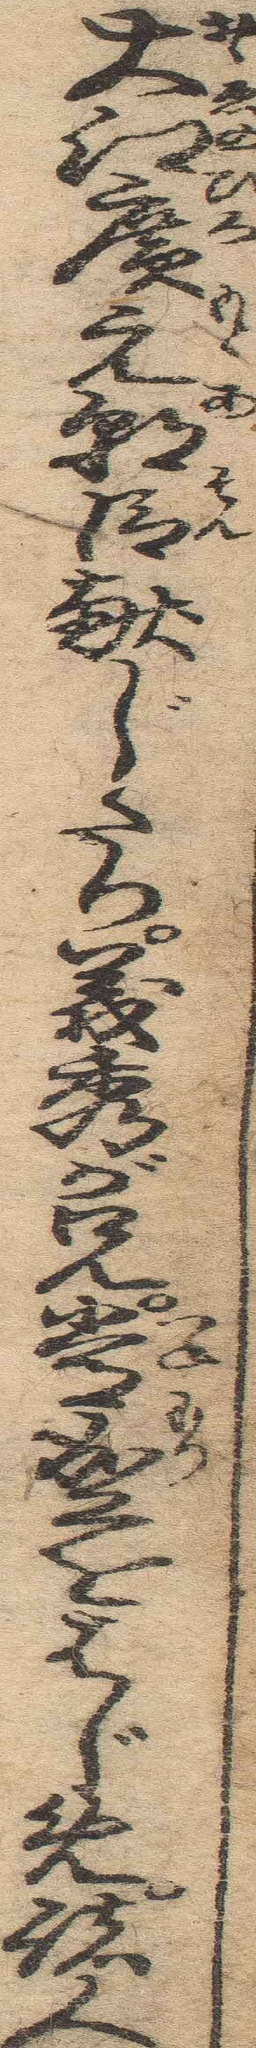大江広元朝臣献じたり。義秀が兄常盛をはじめ。諸人
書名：古今相撲大全
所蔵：東京学芸大学附属図書館 国文学研究資料館
